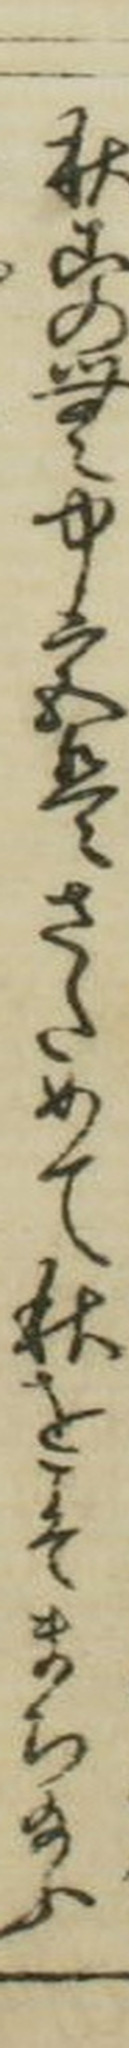秋このむ中宮はさためて秋をこそまち給ふ
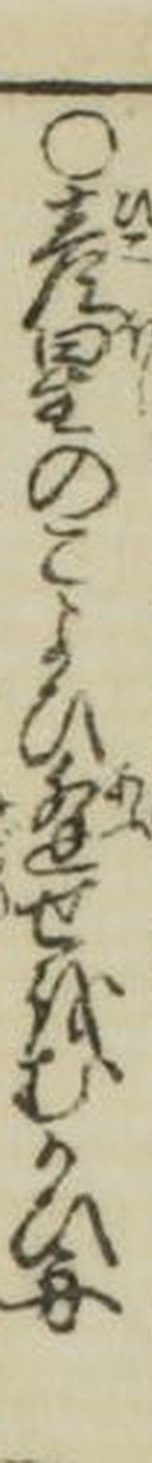○彦星のこよひ逢せをむかひ舟雅房
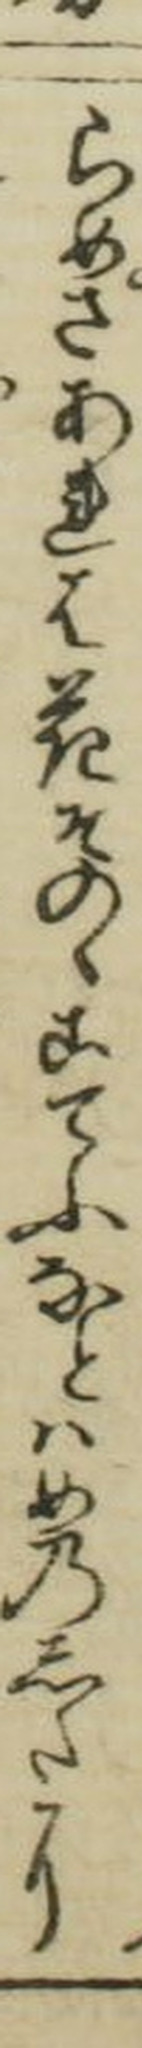らめ。さあれは花そのゝこてふなとはめのしたに
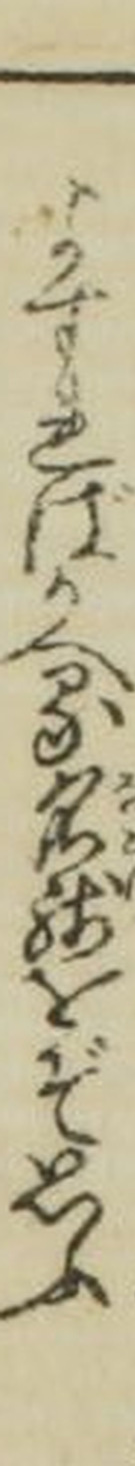よすればかへる名残をぞ思ふ
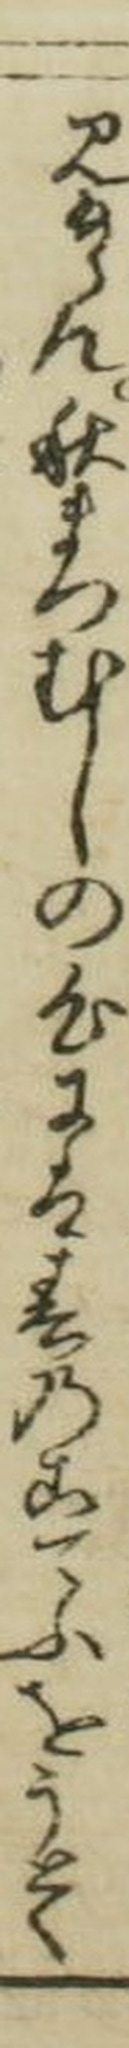見給らん。秋まつむしの心には春のこてふをうとく
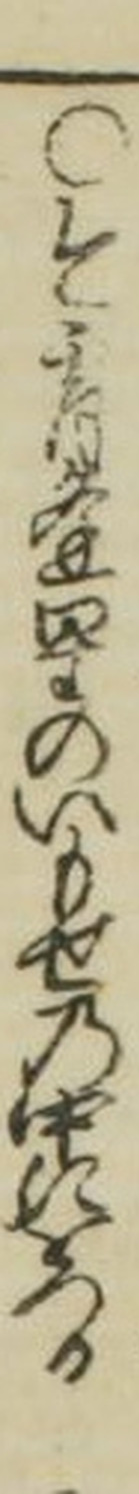○今宵逢星のいもせの中にをつる通福
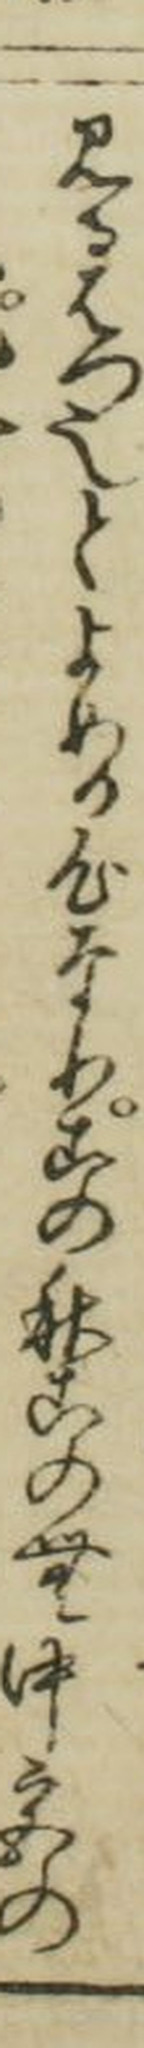見るはつ也とよめる心なり。この秋このむ中宮の
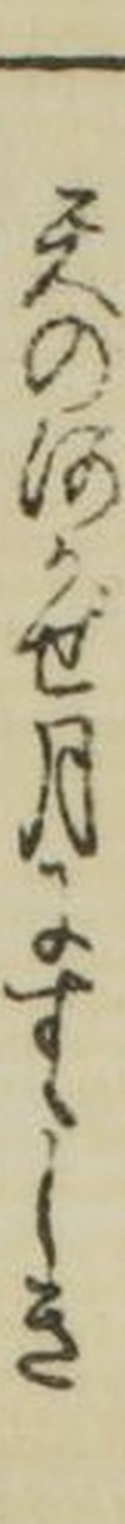天の河かぜ月にすゝしき
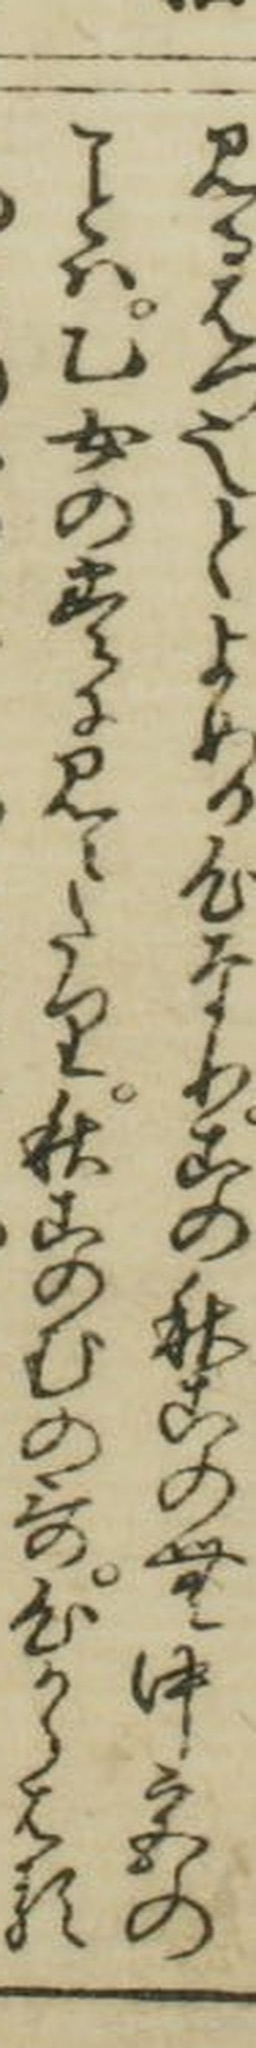ことは。乙女の巻に見えたり。秋このむの哥。心からはる
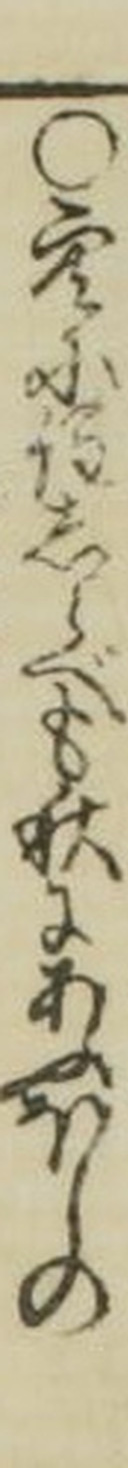○空に住しらべも秋にあふほしの雅直
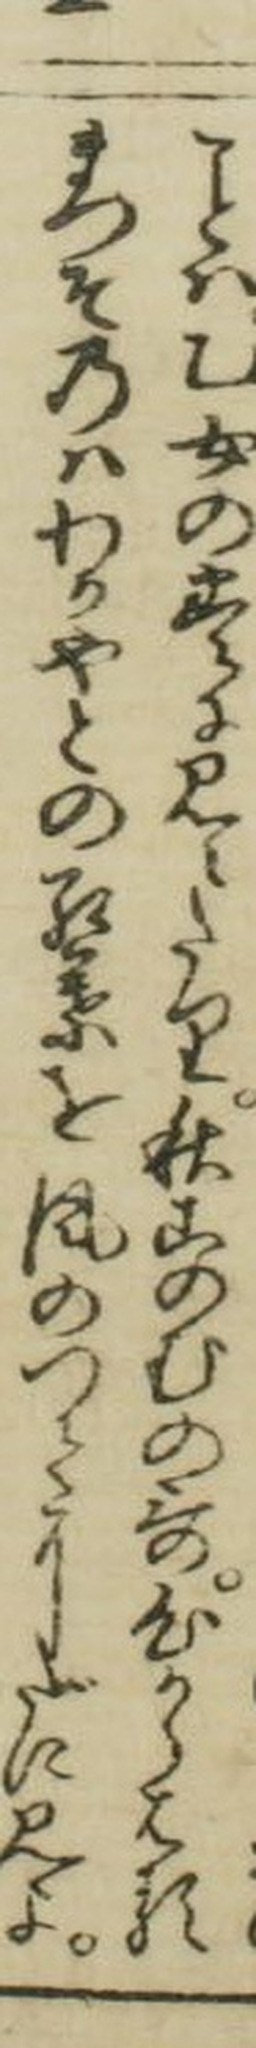まつそのはわかやとの紅葉を風のつてにだに見よ。
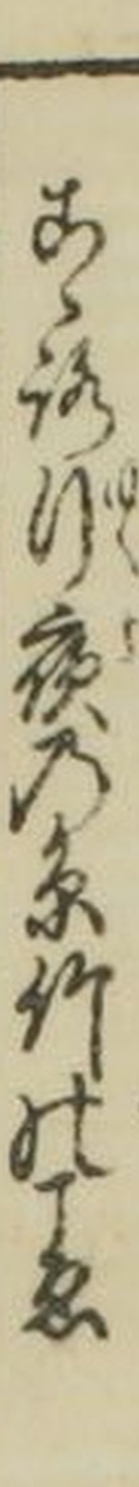こゝろ行夜の糸竹のこゑ
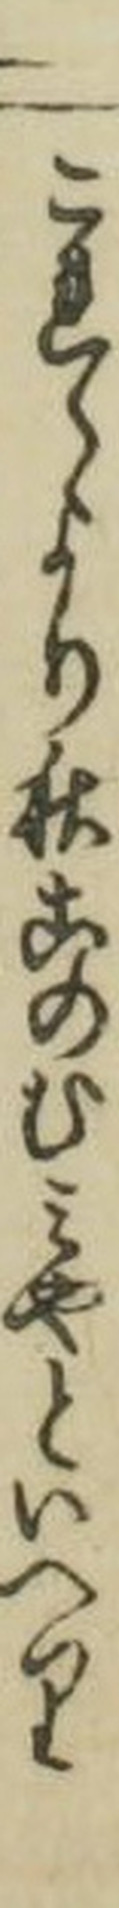こららより秋このむみやといへり
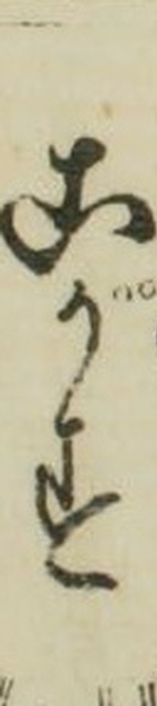こがす
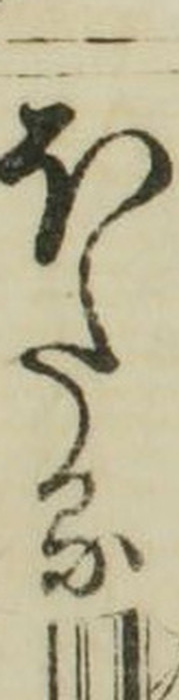ほたる
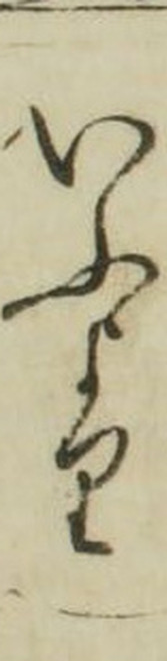いふより
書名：女源氏教訓鑑
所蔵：東京学芸大学附属図書館
